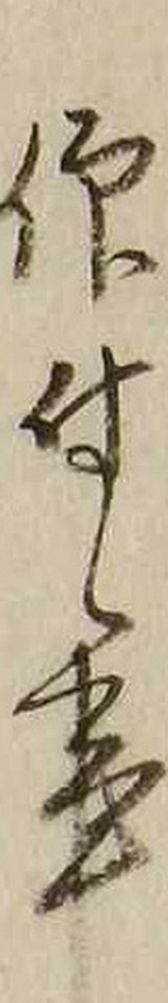仰付候事
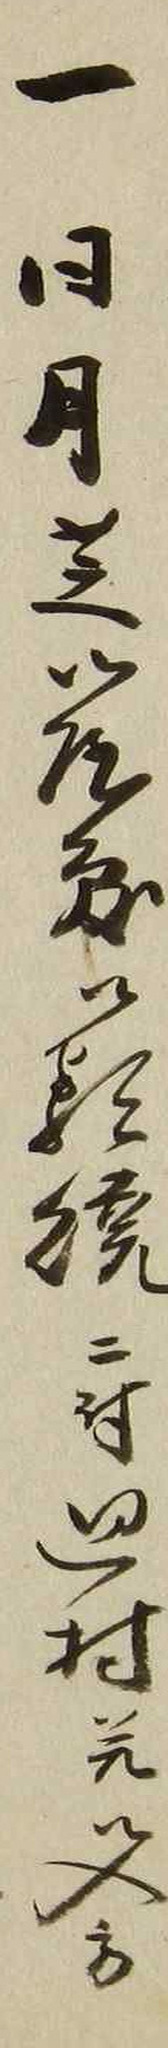一同月芝御屋敷御類焼ニ付廻村并御入方
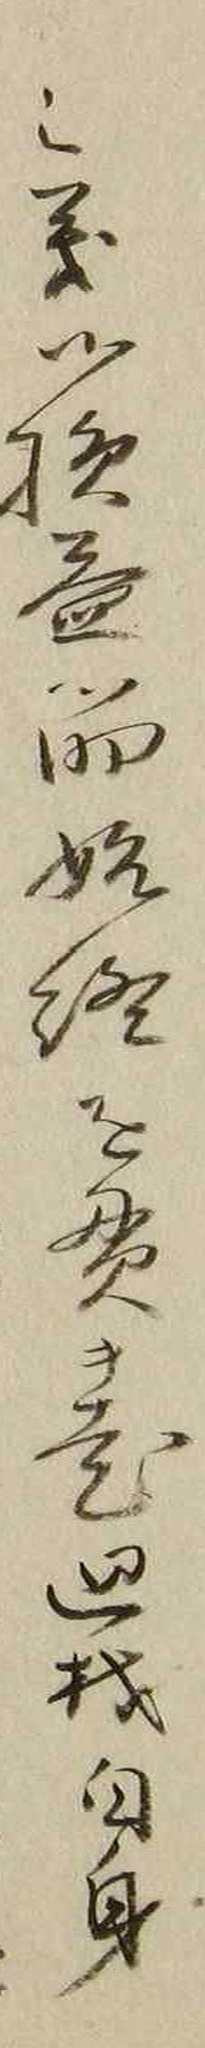之義御損益筋始終を貫キ老廻材自身
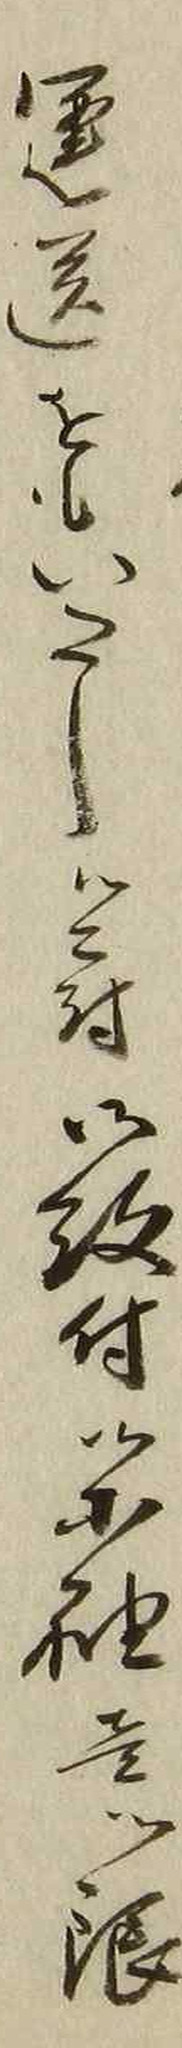運送をもいたし候ニ付御紋付御小袖壱ツ銀
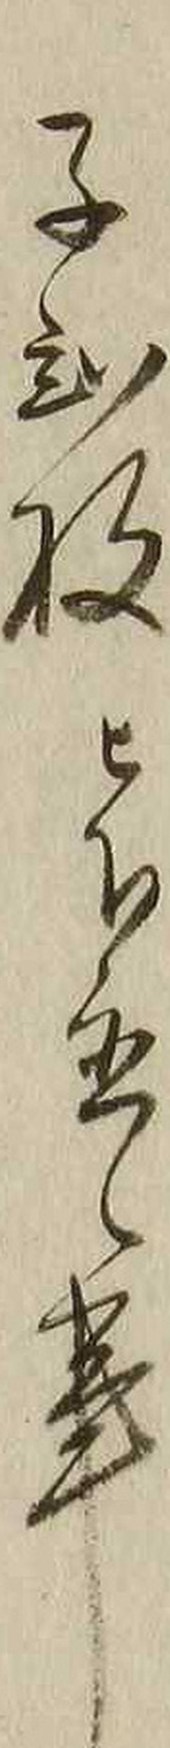子弐枚被下置候事
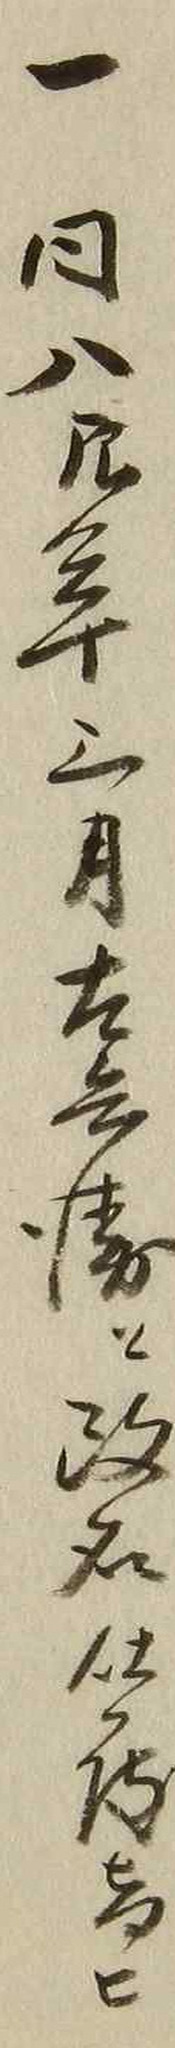一同八辰年三月左兵衛と改名仕度旨被
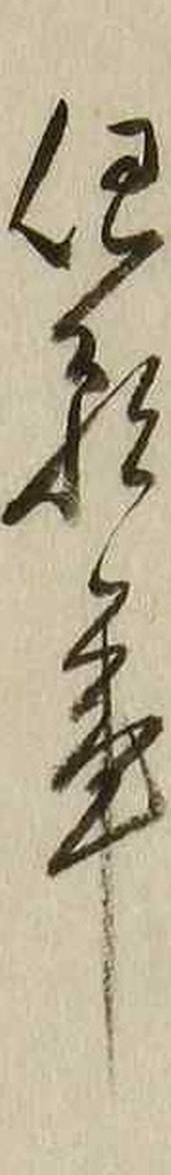任願候事
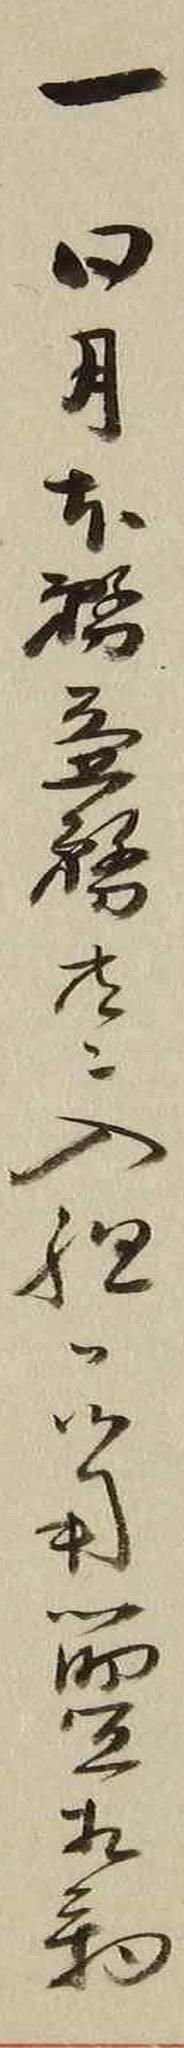一同月本務兼務共ニ入組候御用筋宜相勤
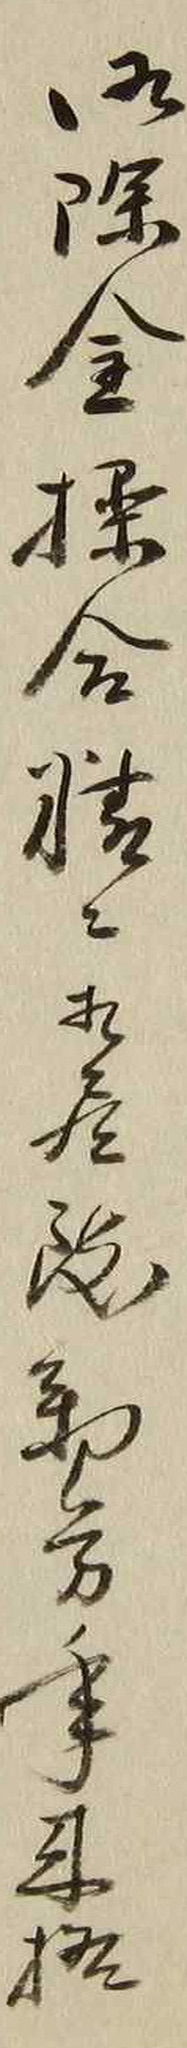御除金操合精々相尽致勤労年来格
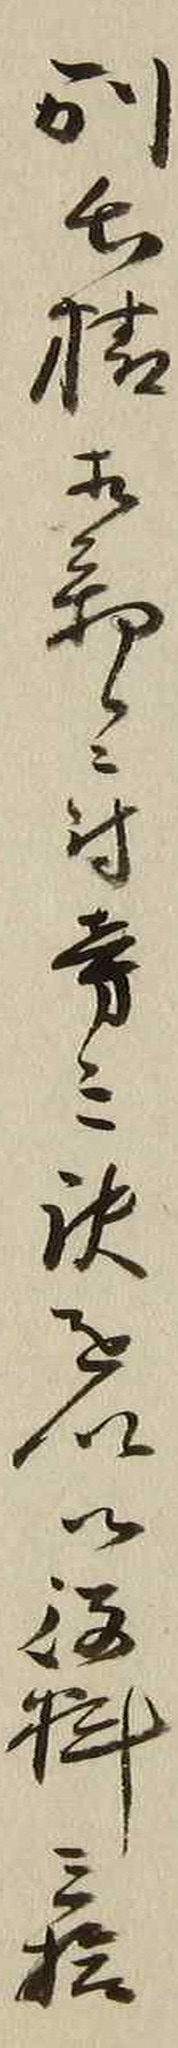別出精相勤候ニ付旁之訳を以御役料三拾
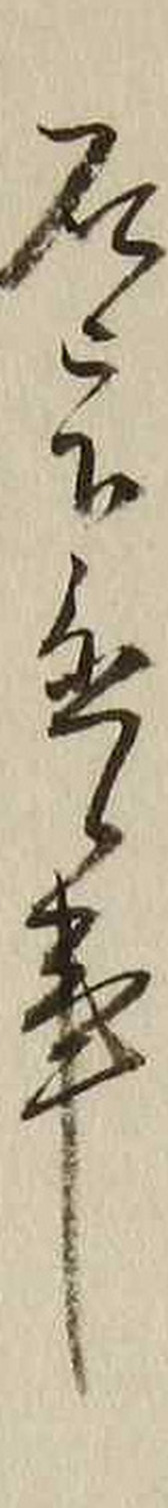石被下置候事
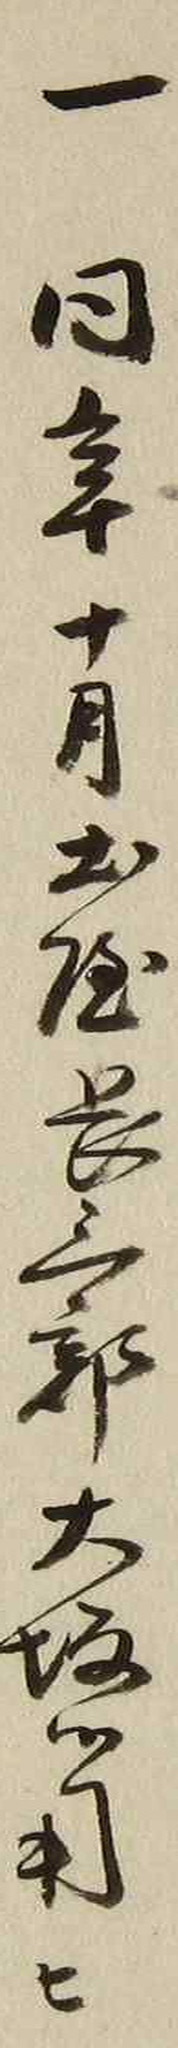一同年十月土屋長三郎大坂御用被
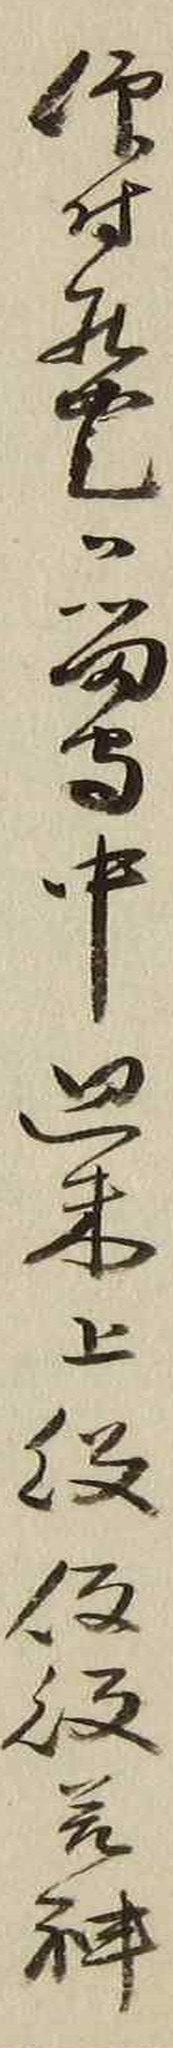仰付罷登御留守中廻米上役仮役并神
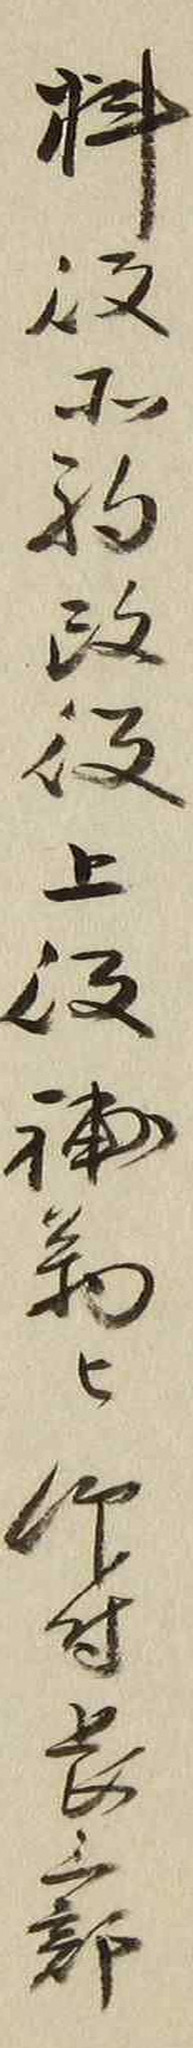料役所駒改役上役補勤被仰付長三郎
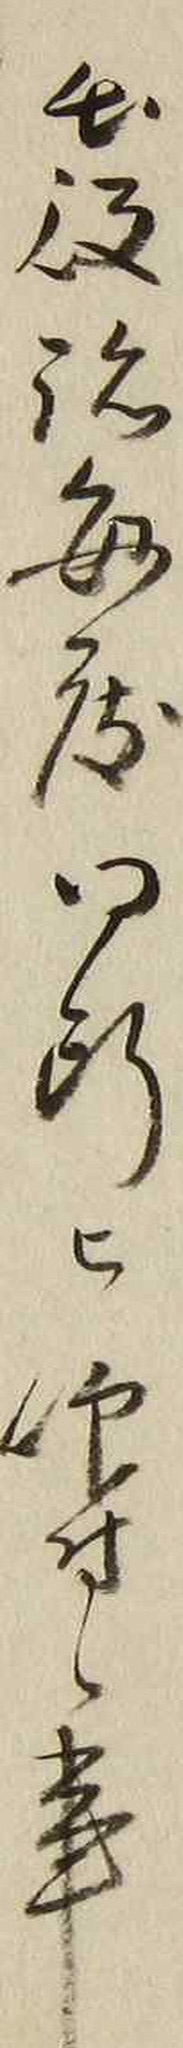出役跡毎度同断被仰付候事
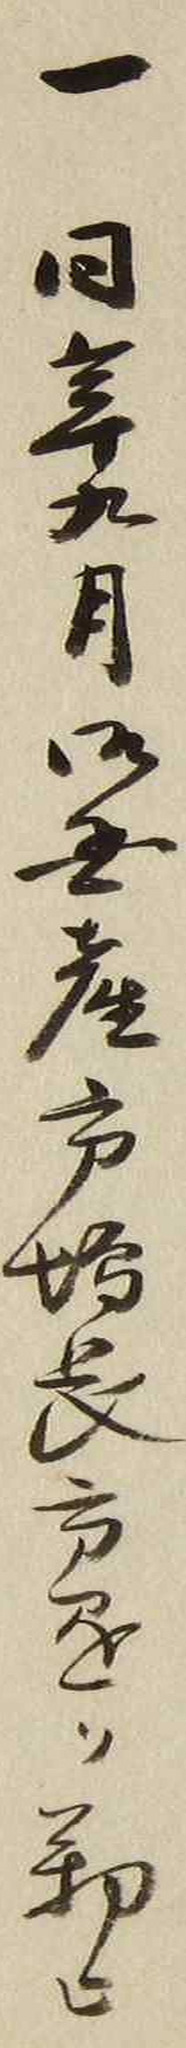一同年九月御国産方増長方懸り勤被
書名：諸士系譜　巻之311　し之部1
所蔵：会津若松市立会津図書館
